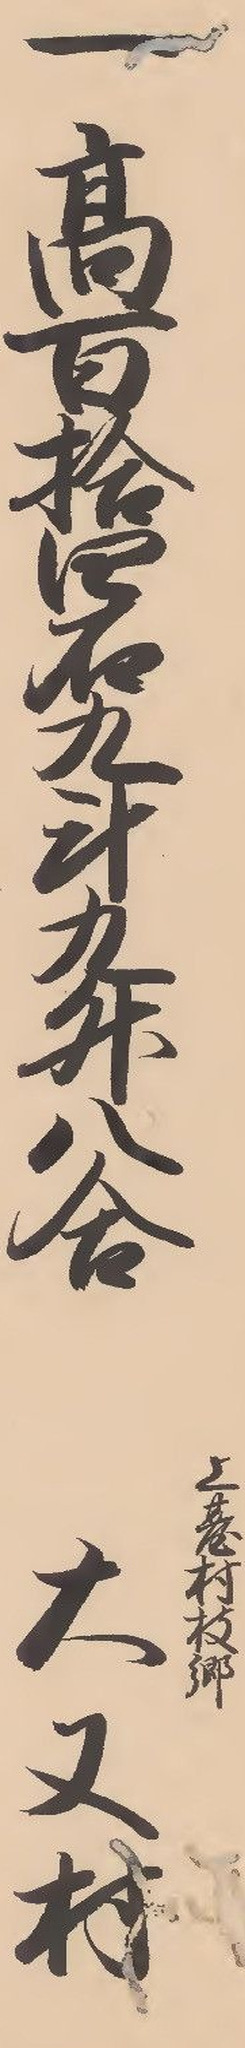一高百拾四石九斗九升八合大又村
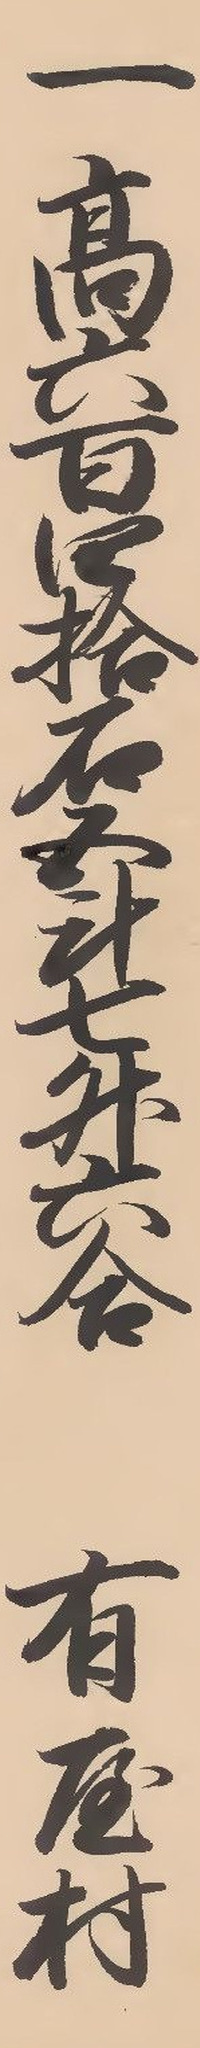一高六百四拾石五斗七升六合有屋村
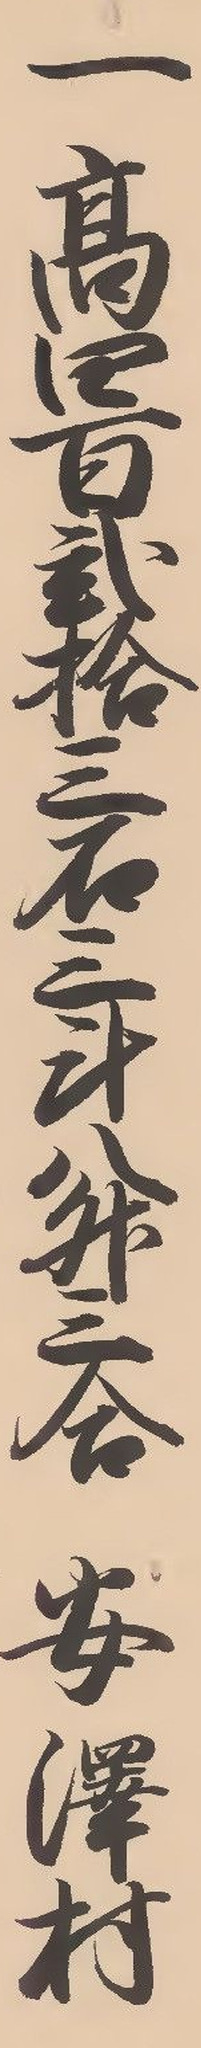一高四百弐拾三石三斗八升三合安沢村
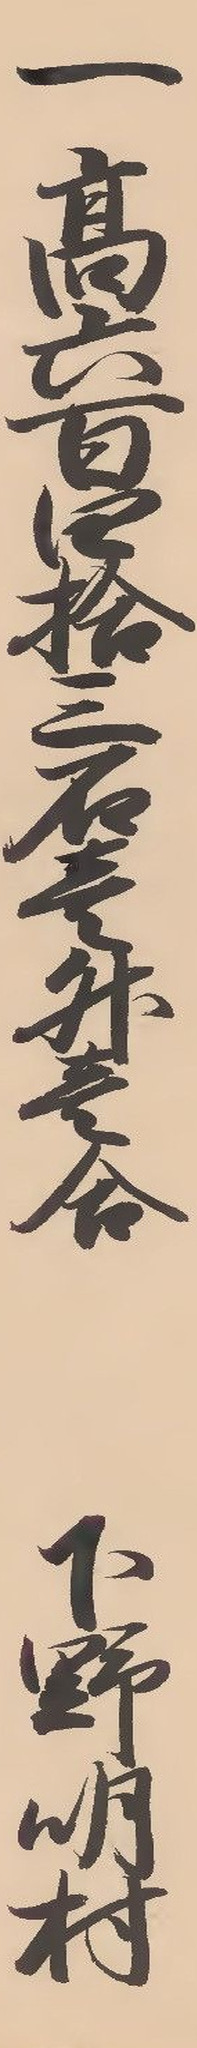一高六百四拾三石壱升壱合下野明村
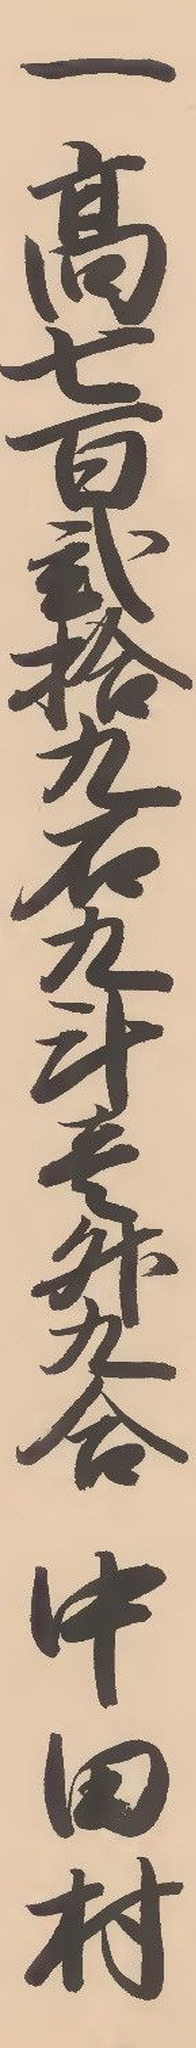一高七百弐拾九石九斗壱升九合中田村
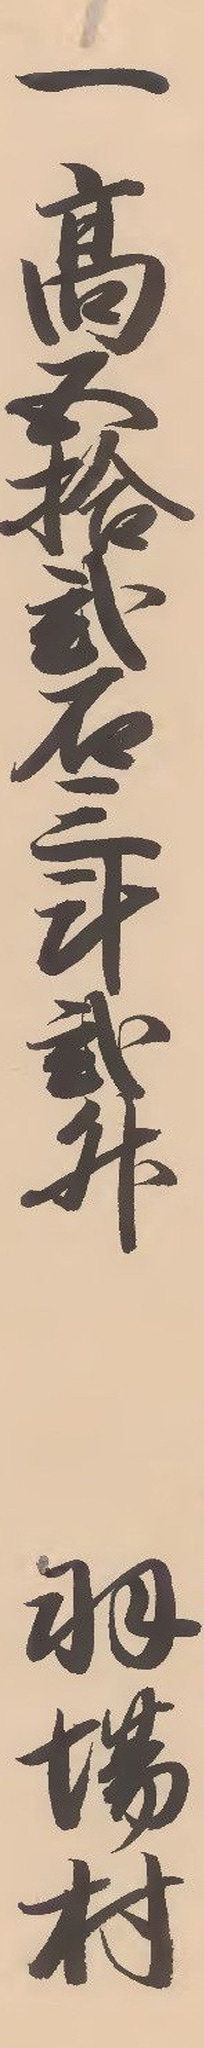一高五拾弐石三斗弐升羽場村
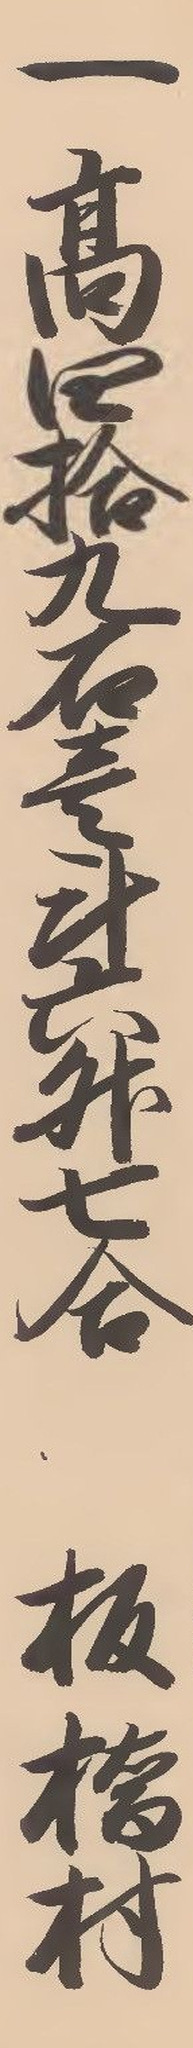一高四拾九石壱斗六升七合板橋村
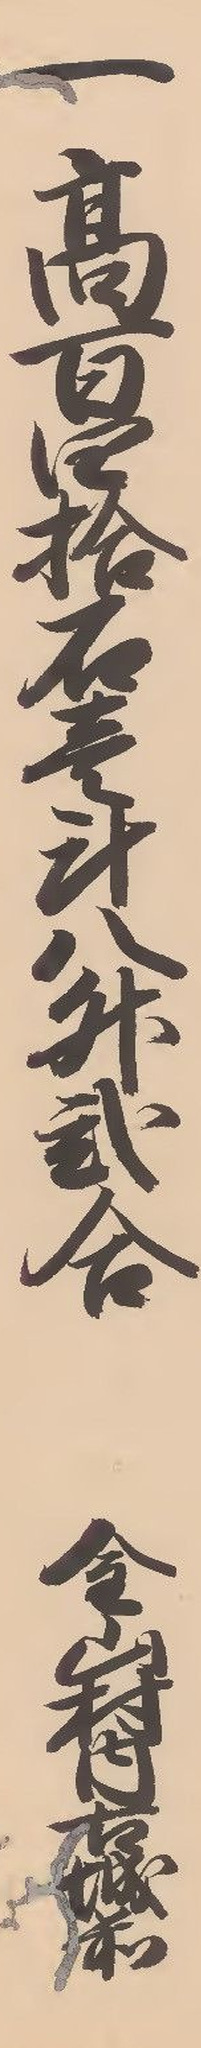一高百四拾石壱斗八升弐合金山村内古城前

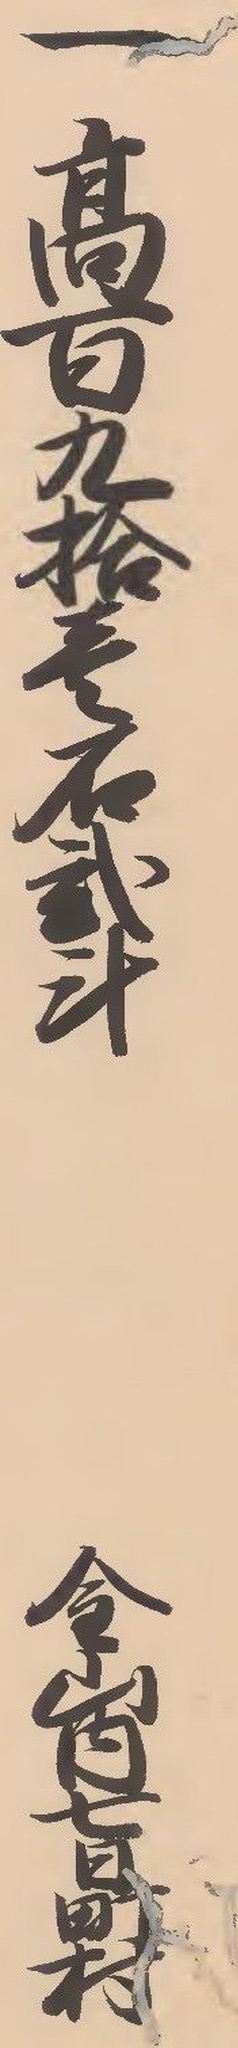一高百九拾壱石弐斗金山内七日町村
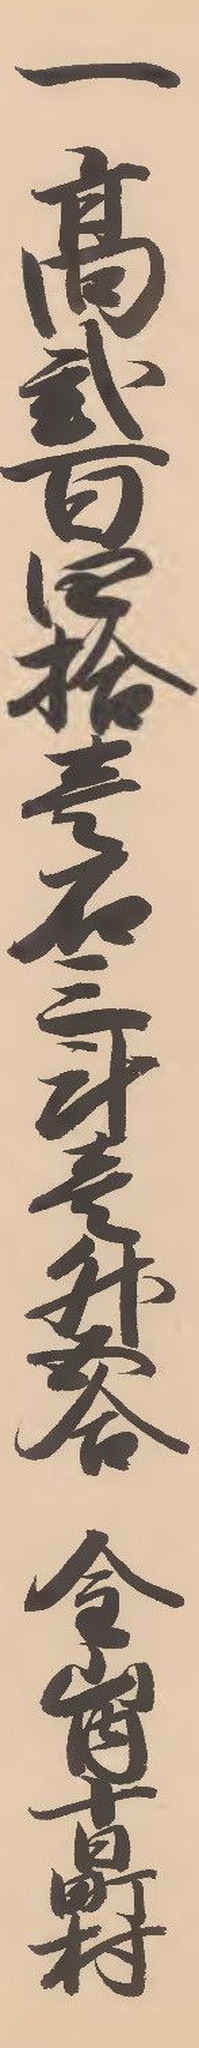一高弐百四拾壱石三斗壱升五合金山内十日町村
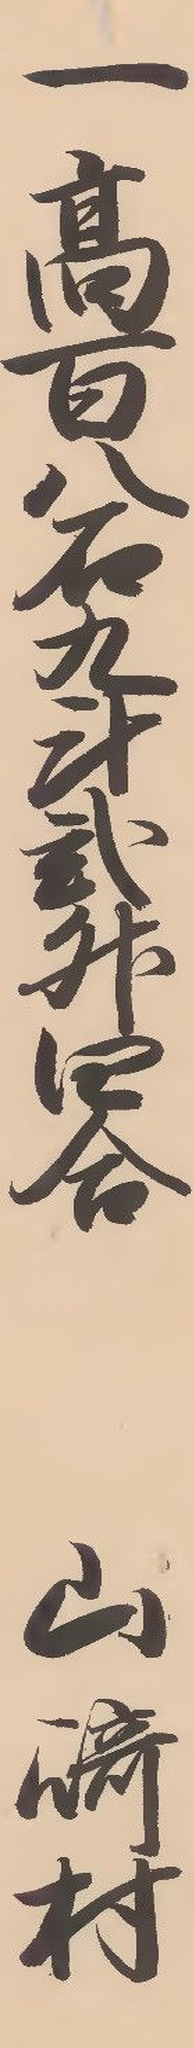一高百八石九斗弐升四合山崎村
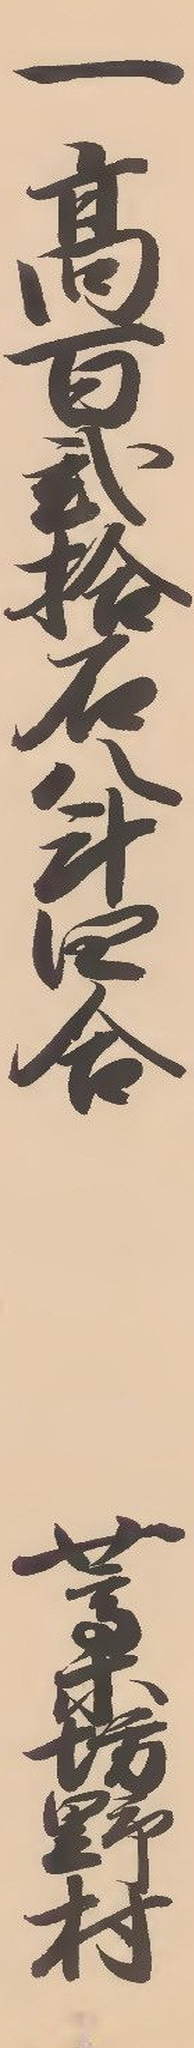一高百弐拾石八斗四合藁坊野村
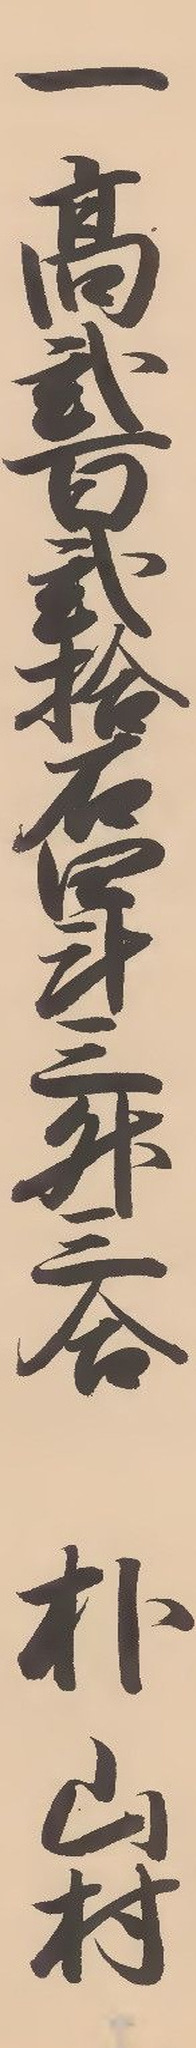一高弐百弐拾石四斗三升三合朴山村
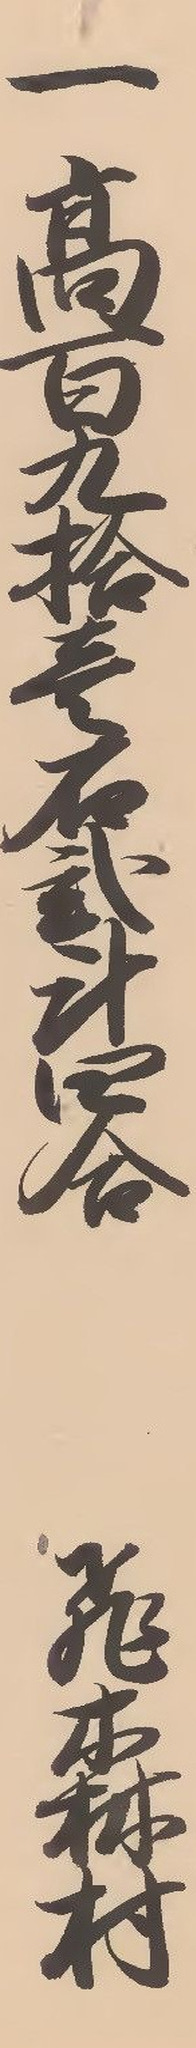一高百九拾壱石弐斗四合飛森村
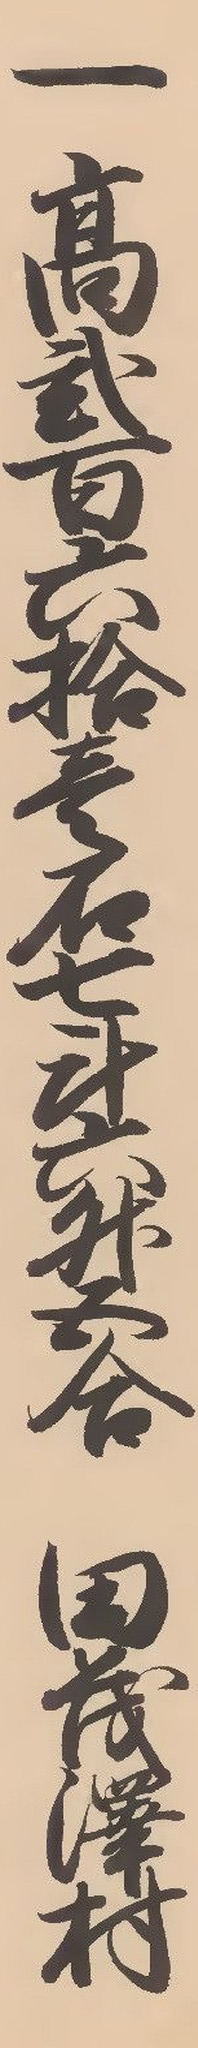一高弐百六拾壱石七斗六升五合田茂沢村
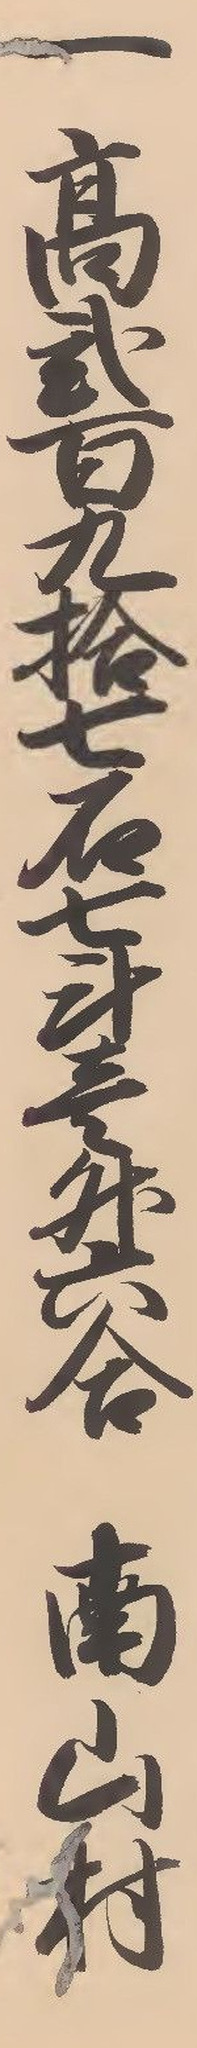一高弐百九拾七石七斗壱升六合南山村
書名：出羽国郷帳　３
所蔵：国立公文書館 National Archives of Japan
